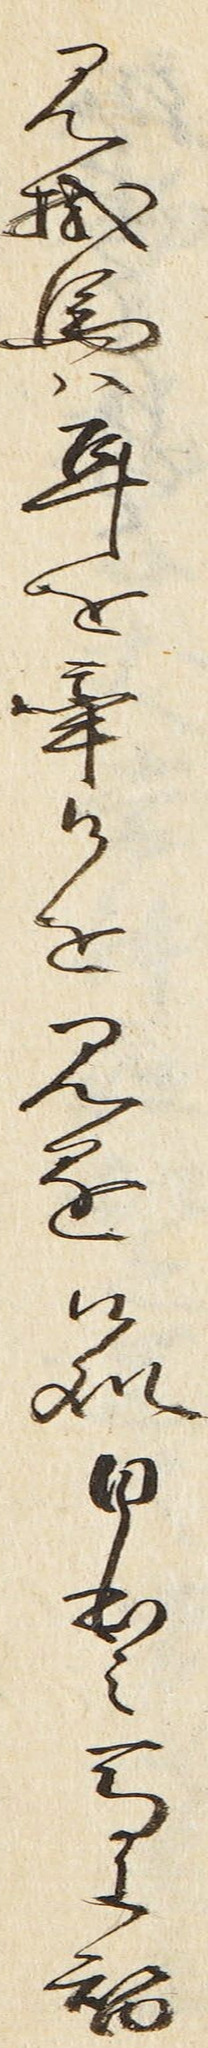見掛馬は耳を牽候を見懸候処日本之馬に替
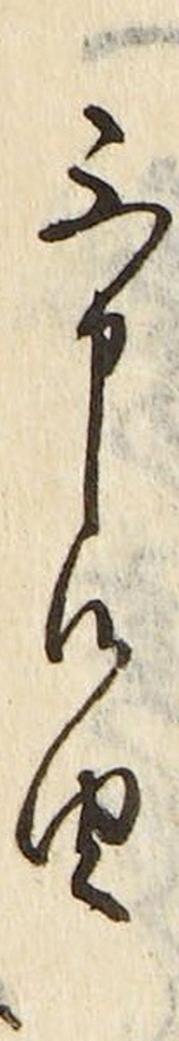不申候由

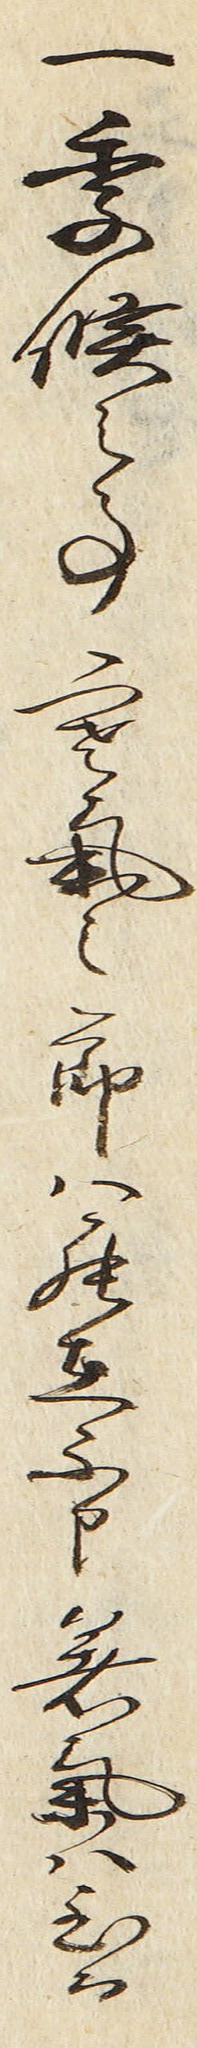一季候之事寒気之節罷在不申暑気は至而
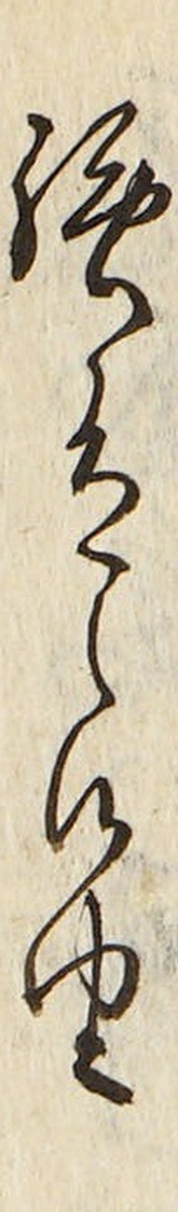強有之候由
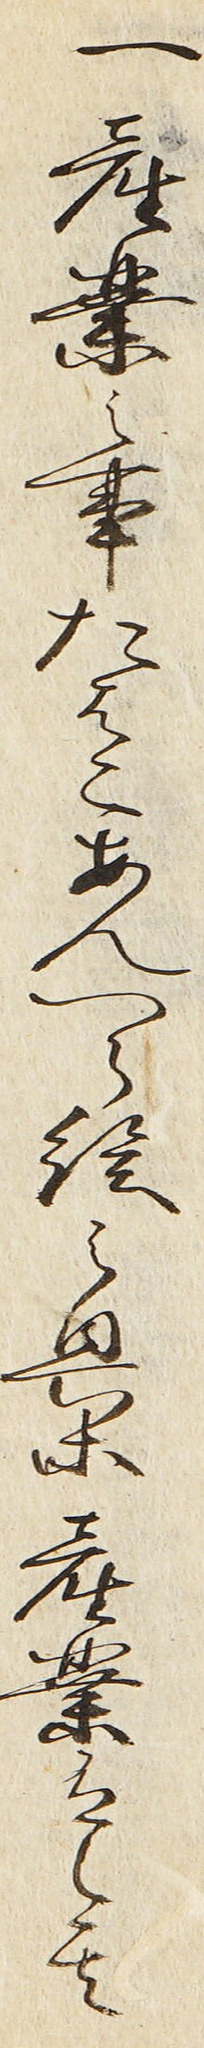一産業之事たはこあんへら絵之具等産業有之其
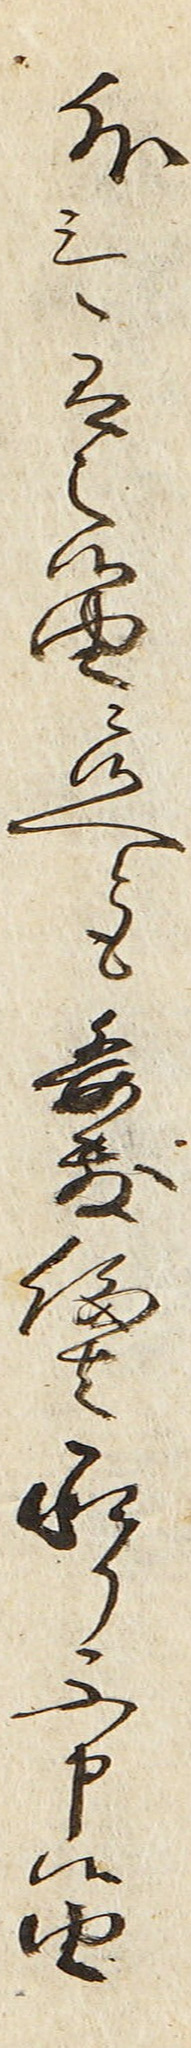外シヽ有之候由に候へとも委敷備は承り不申候由
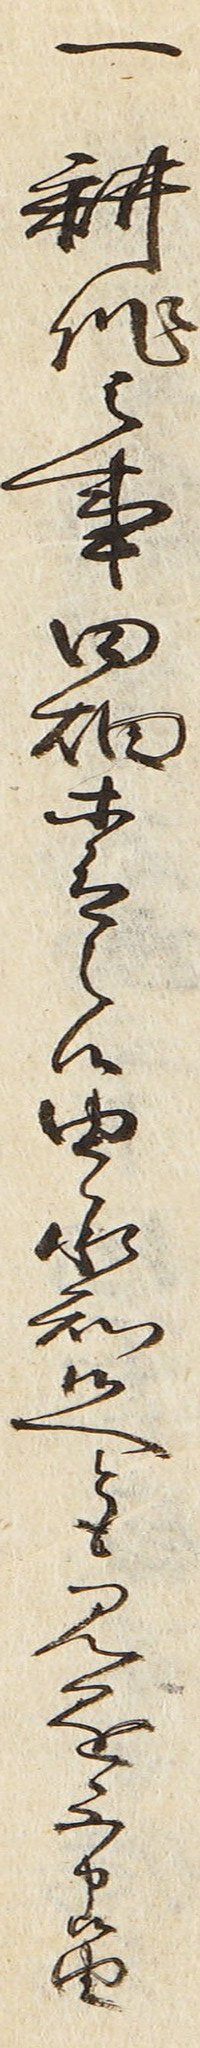一耕作之事田畑等有之候由承知候へとも見懸不申候由
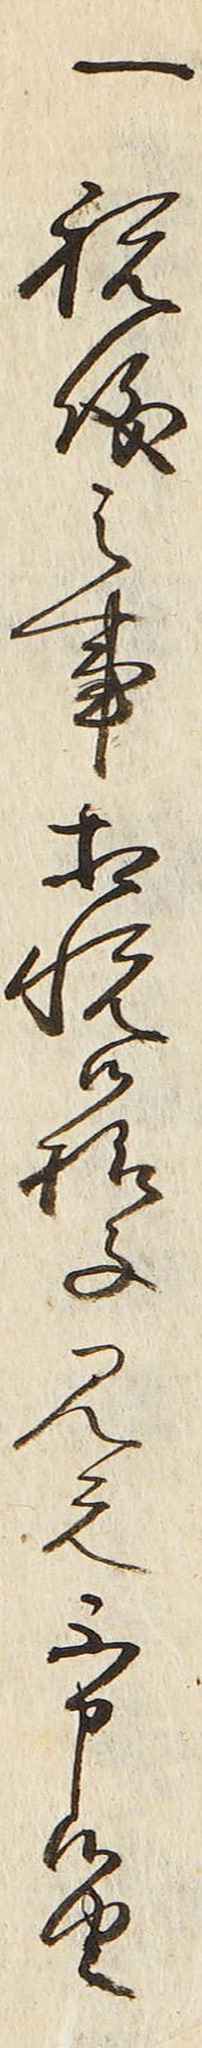一祝儀之事相祝候様子見え不申候由
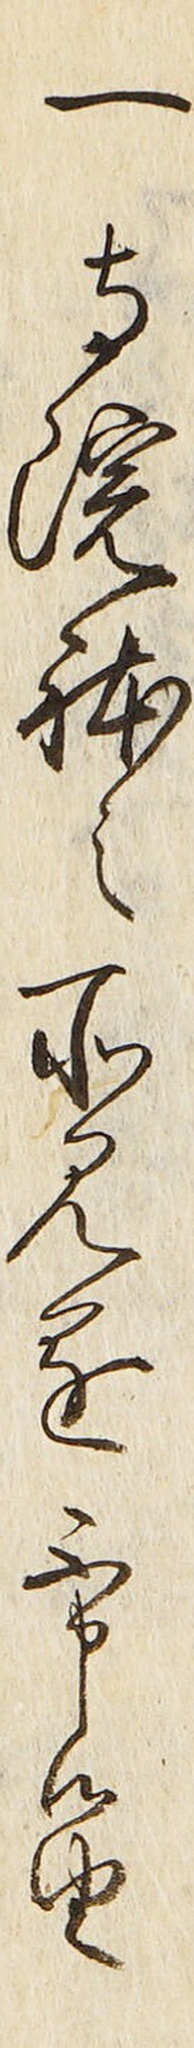一寺院躰之所見懸不申候由
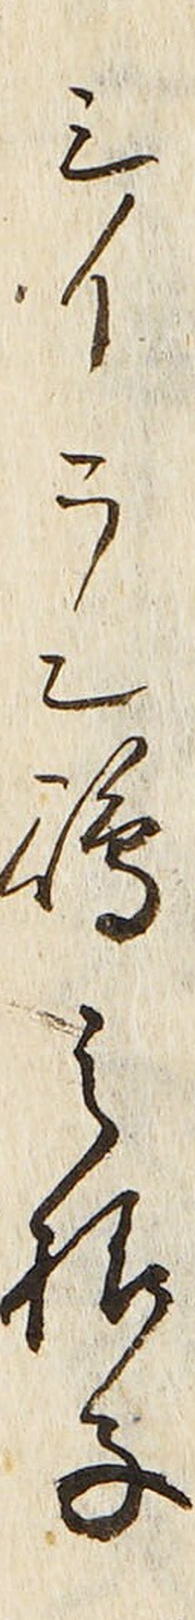シイラン嶋之様子
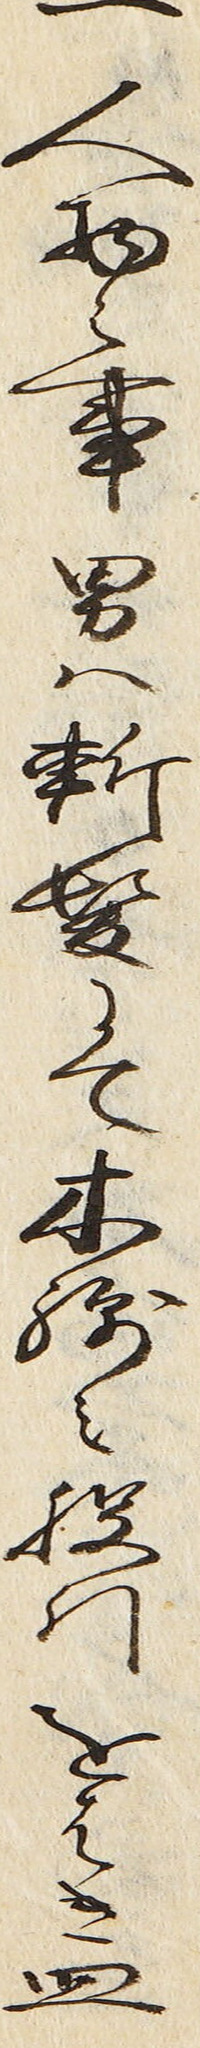一人物之事男は斬髪にて木綿之股引をはき皿
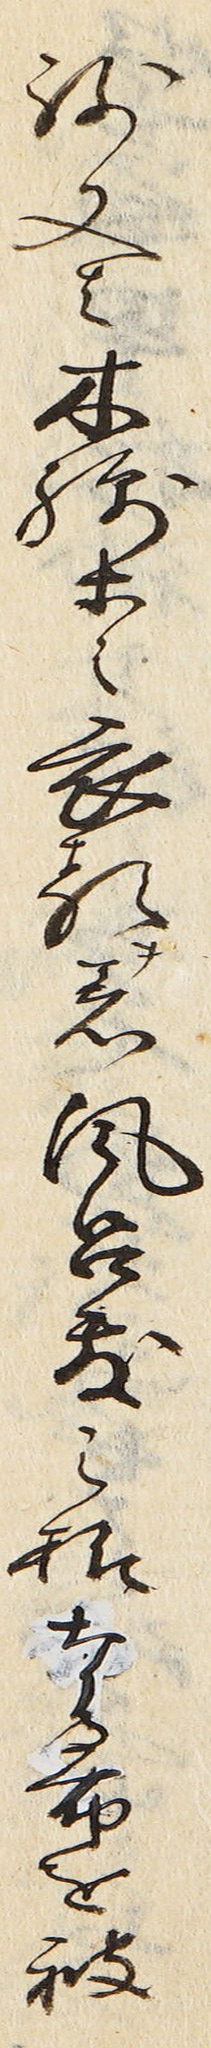紗又は木綿等之衣類着風呂敷之様なる布を被
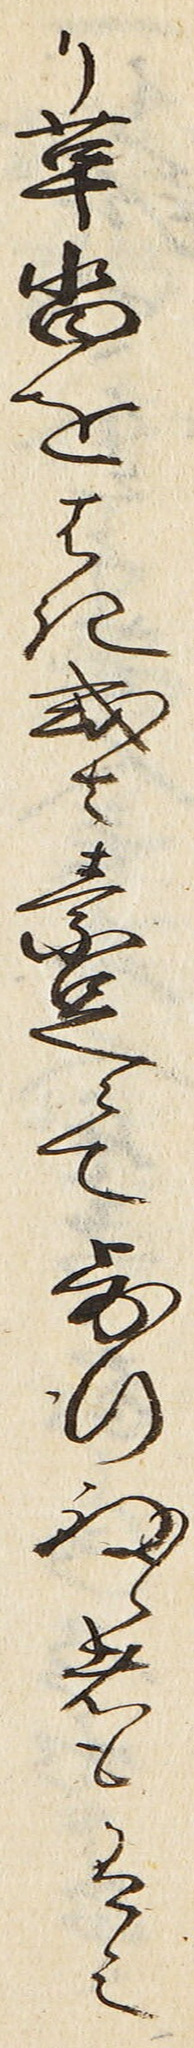り革沓をはき或は素足にて歩行致候者も有之
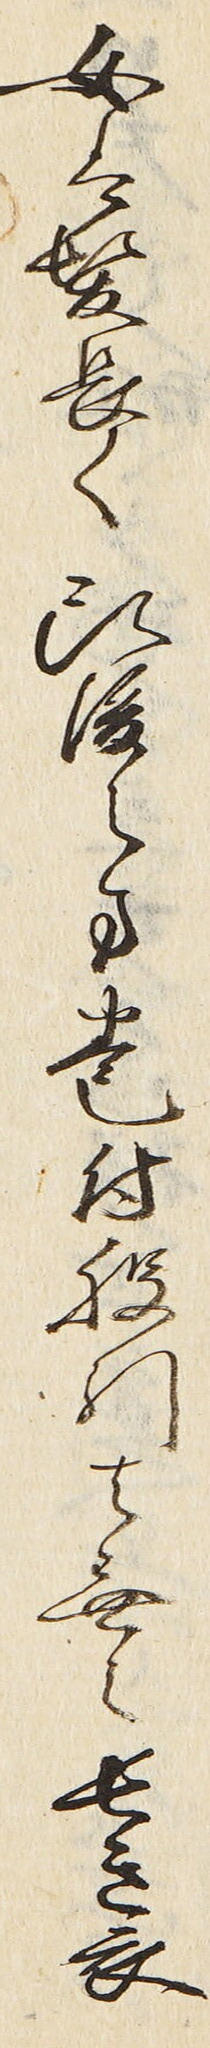女は髪長く頭後之方巻付股引は無之長き衣
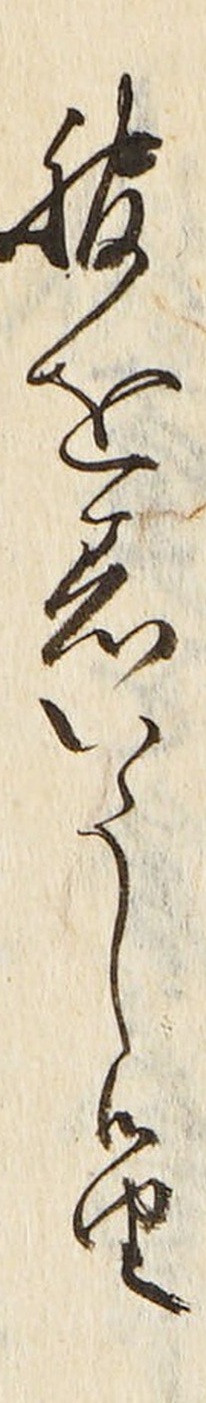服を着いたし候由
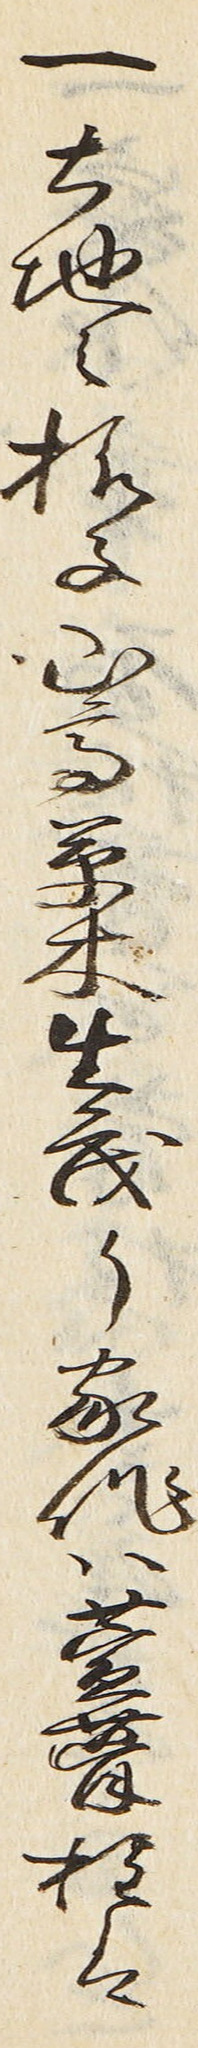一土地之様子山高草木生茂り家作は萱葺柱は
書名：土佐中浜万次郎漂流記
